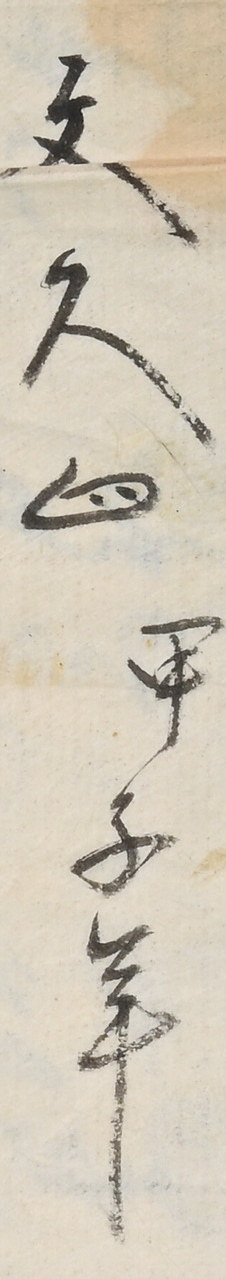㊞文久四甲子年
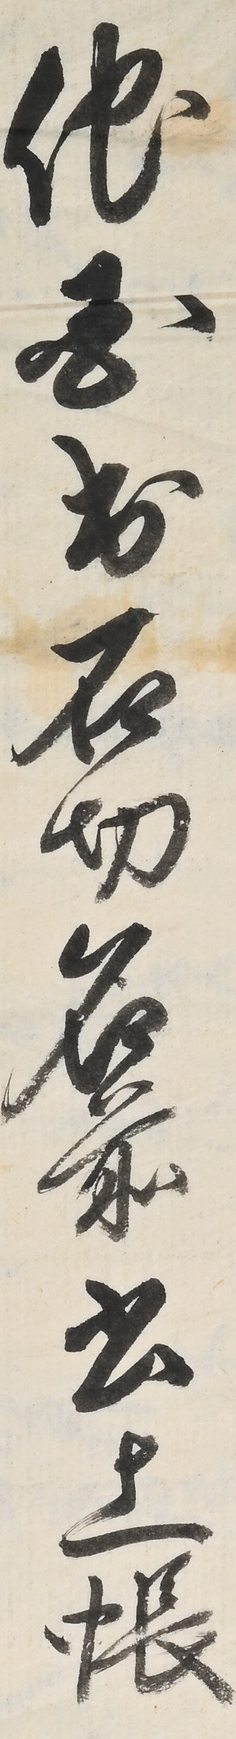他国出石切名前書上帳

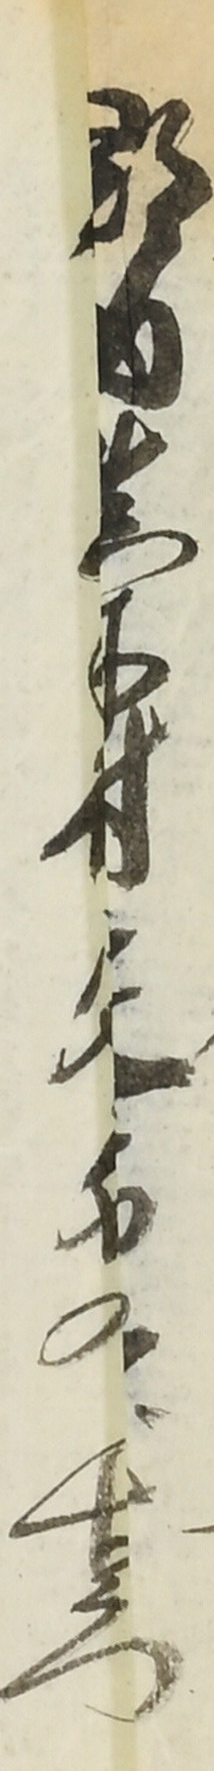郡内真木村▢▢▢右衛門
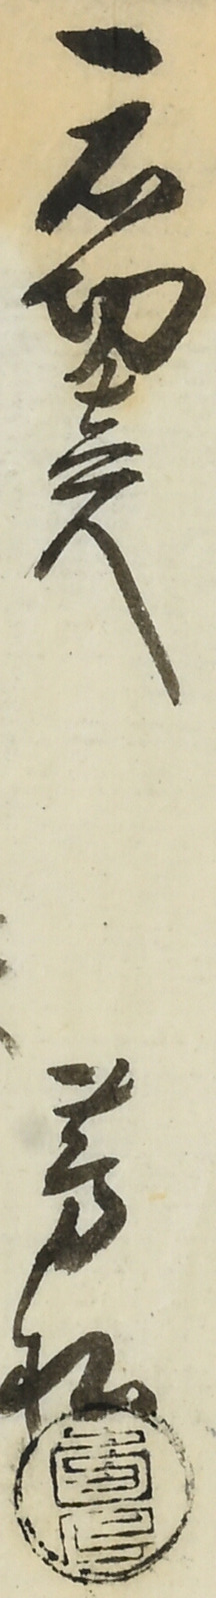一石切壱人芳松㊞
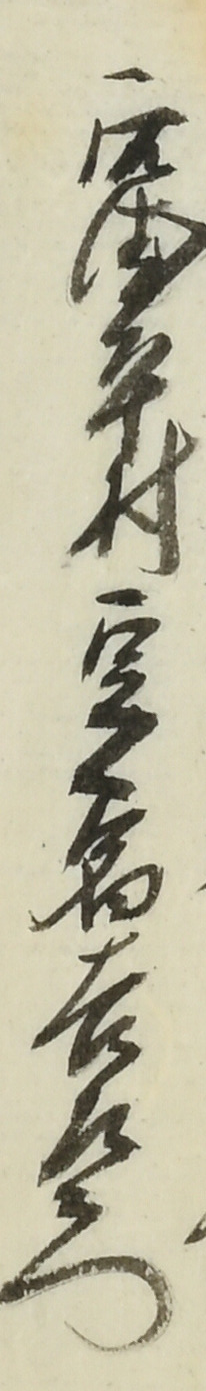窪平村定宿吉左衛門

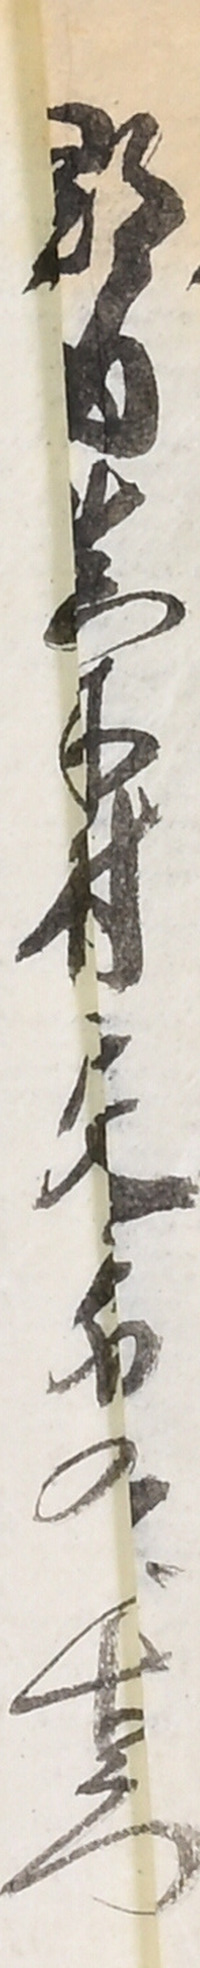郡内真木村▢▢▢右衛門
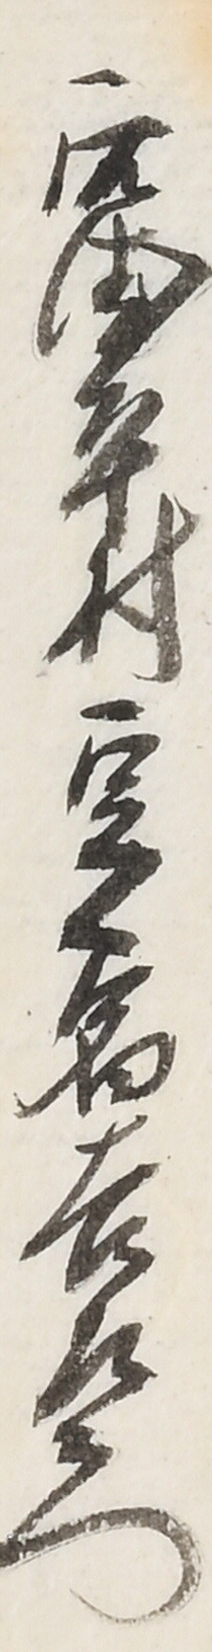窪平村定宿吉左衛門
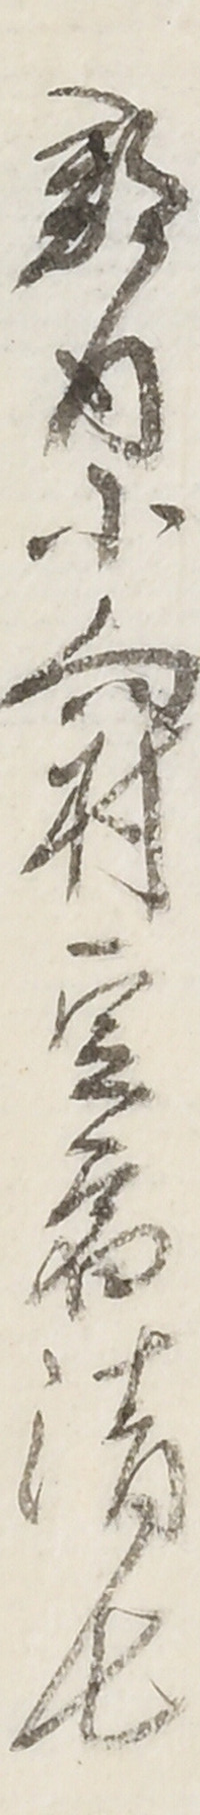郡内小向村定宿清七
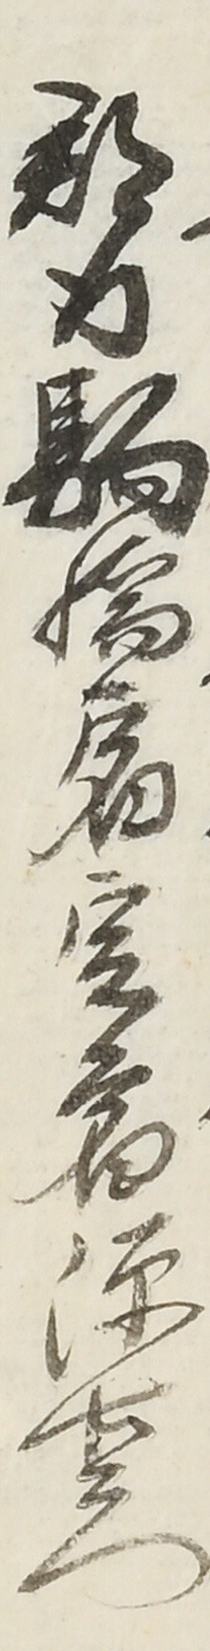郡内駒橋宿定宿源右衛門
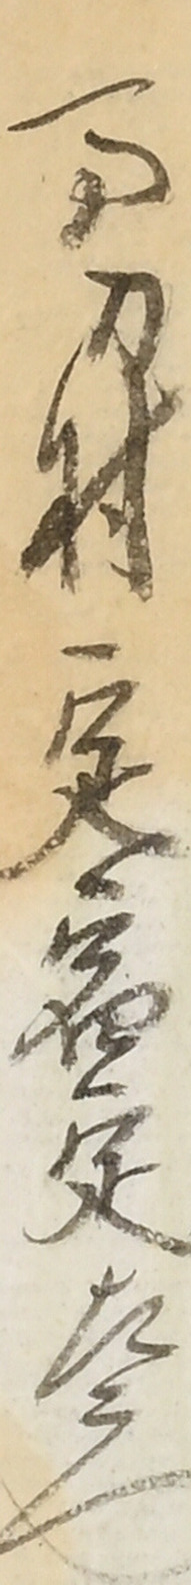万力村定宿定左衛門

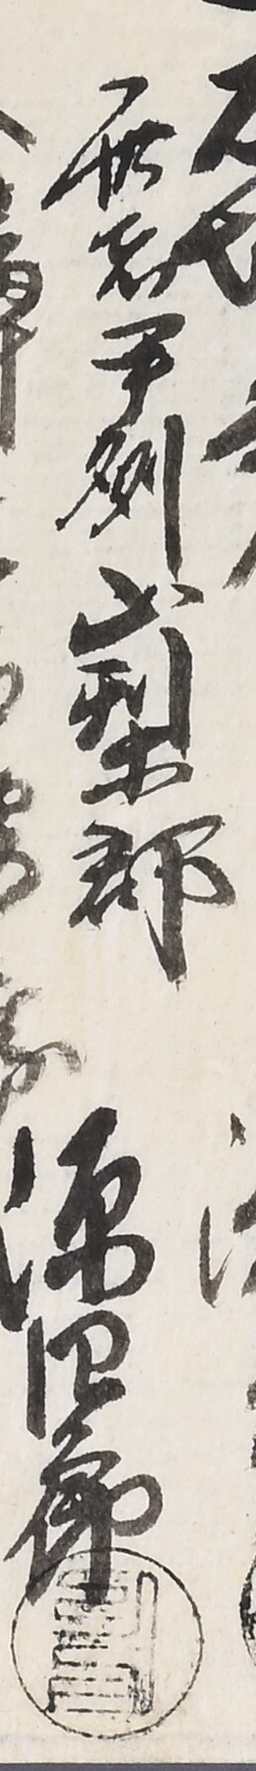此者甲州山梨郡源四郎㊞
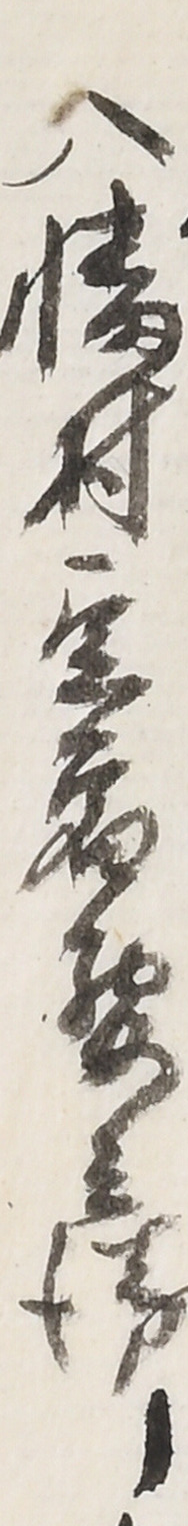八幡村定宿要兵衛
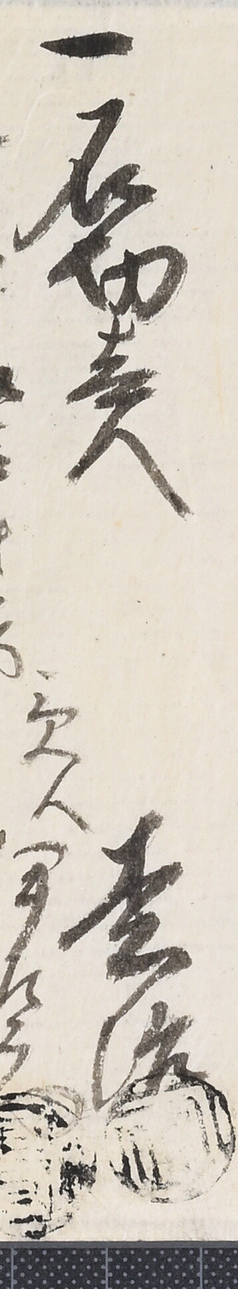一石切壱人松治㊞
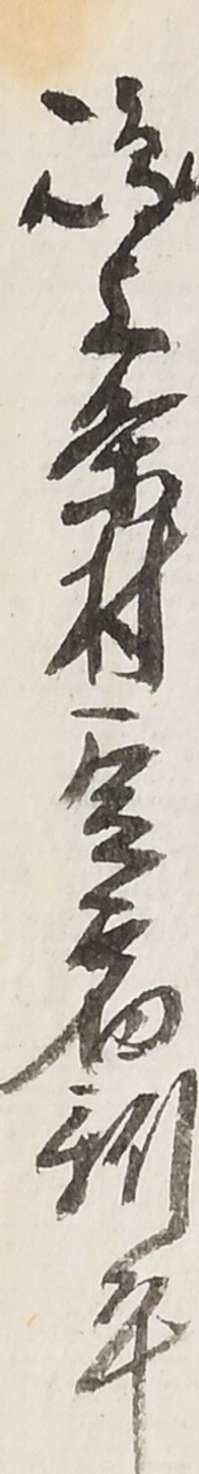島上条村定宿利平
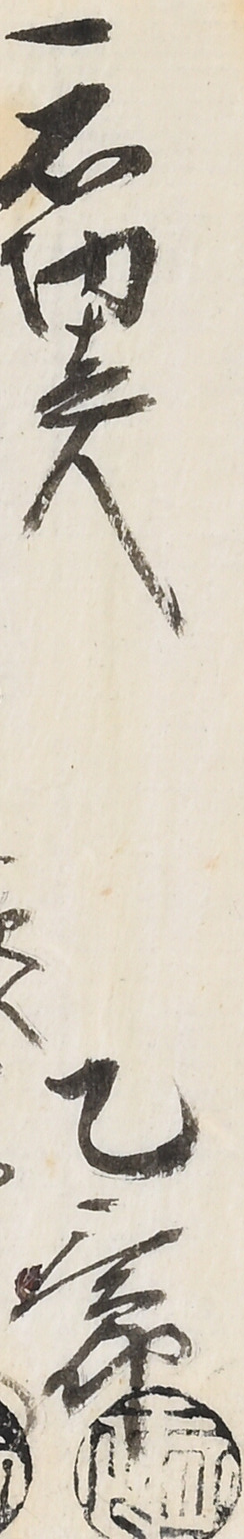一石切壱人松治㊞
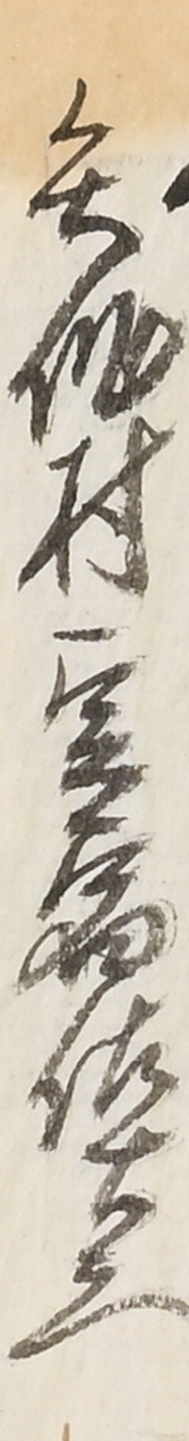矢作村定宿佐右衛門
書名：文久四甲子年正月他国出石切名前書上帳
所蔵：伊那市立高遠町図書館・合同会社AMANE
